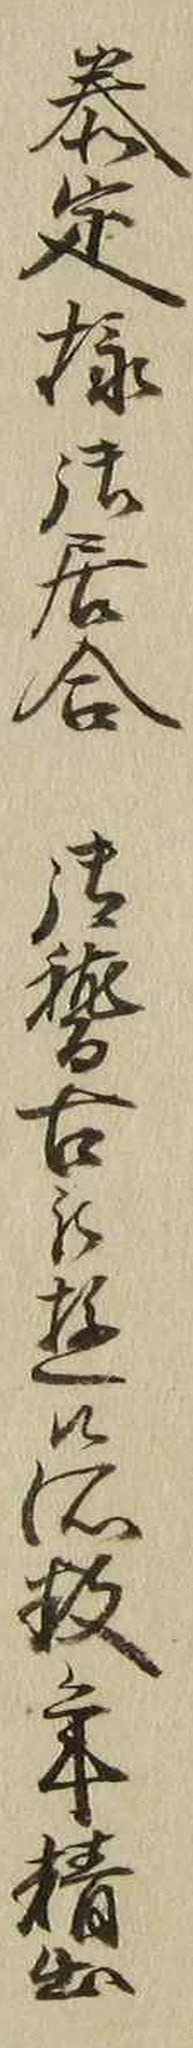恭定様御居合御稽古被遊候所数年精出
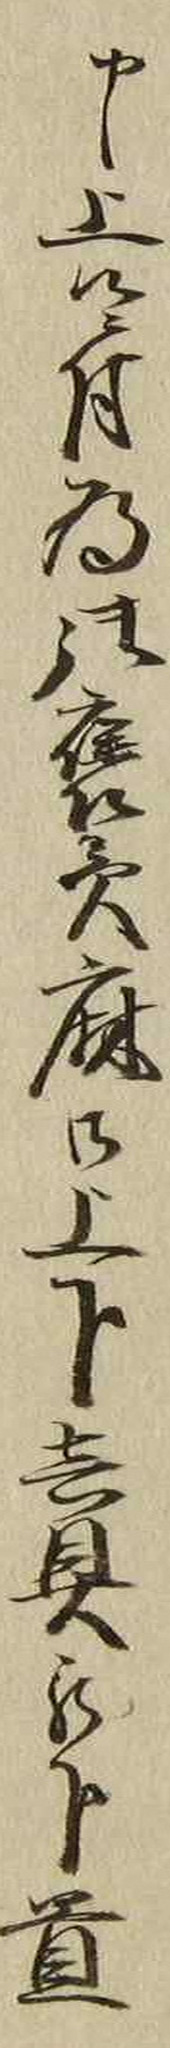申上候に付為御褒美麻御上下壱具被下置
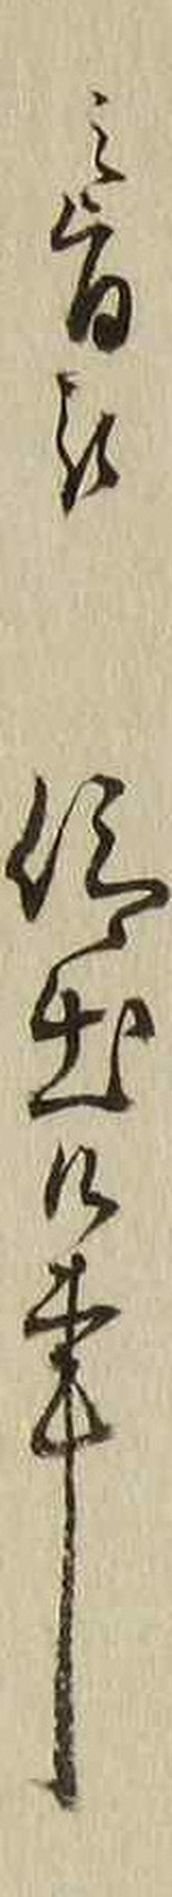之旨被仰出候事
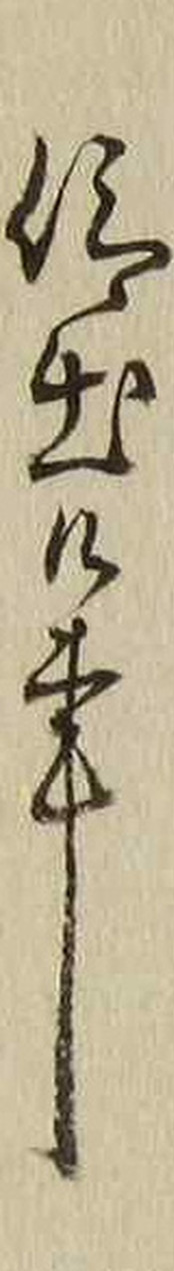仰出候事
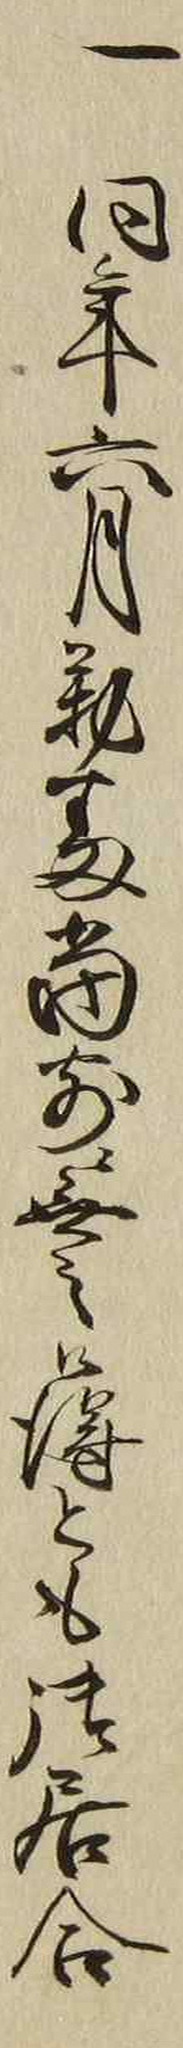一同年六月勤番当前に無之候得とも御居合
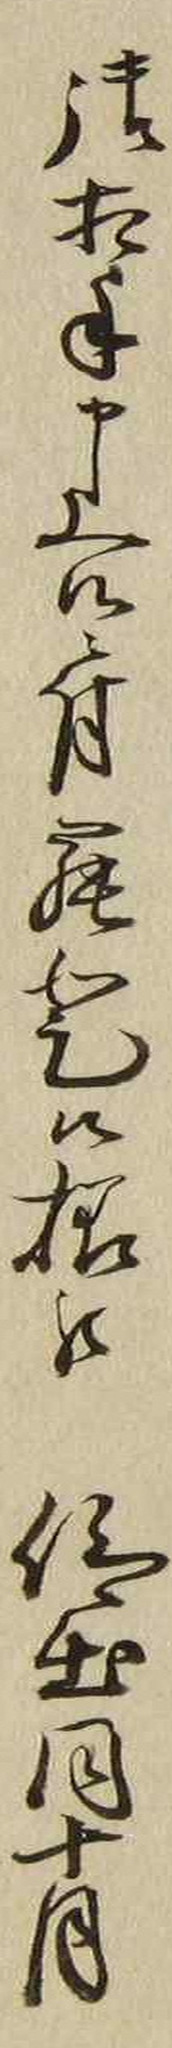御相手申上候に付罷登侯様被仰出同十月
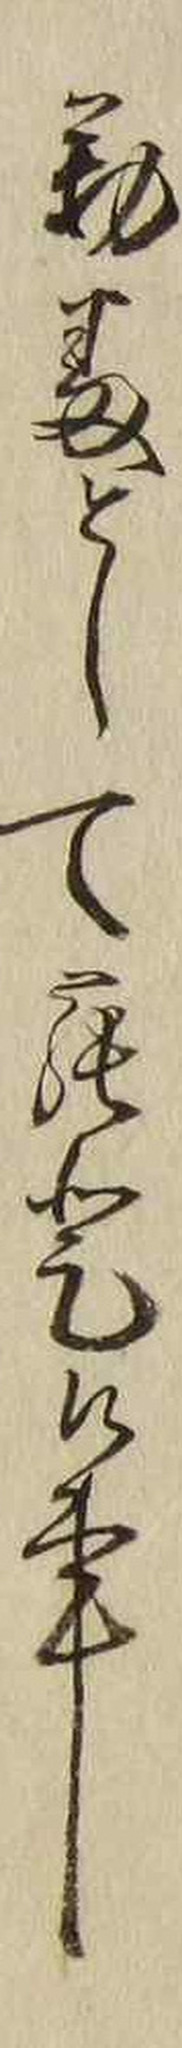勤番として罷登候事
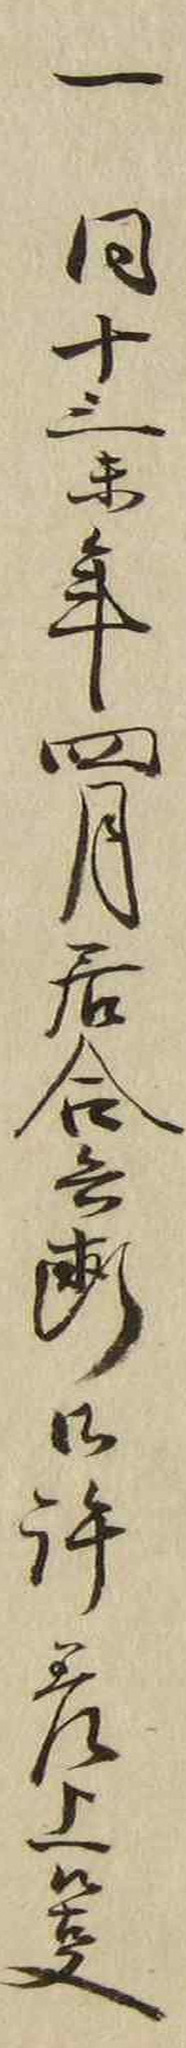一同十三未年四月居合兵術御許差上候事

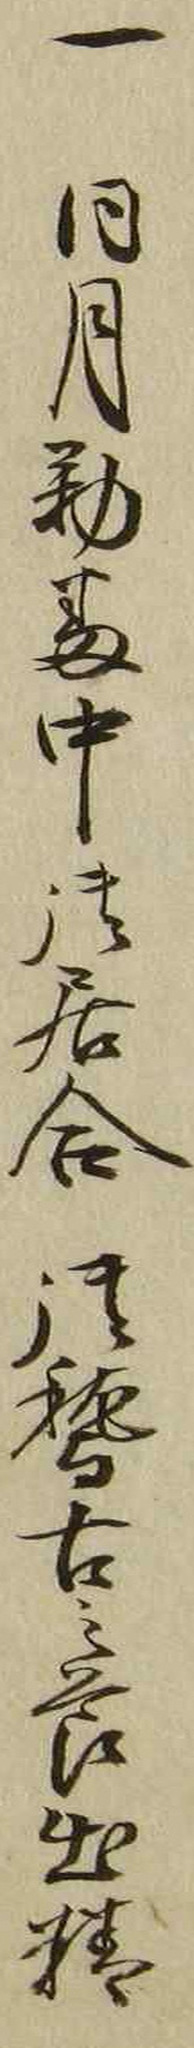一同月勤番中御居合御稽古之節出精
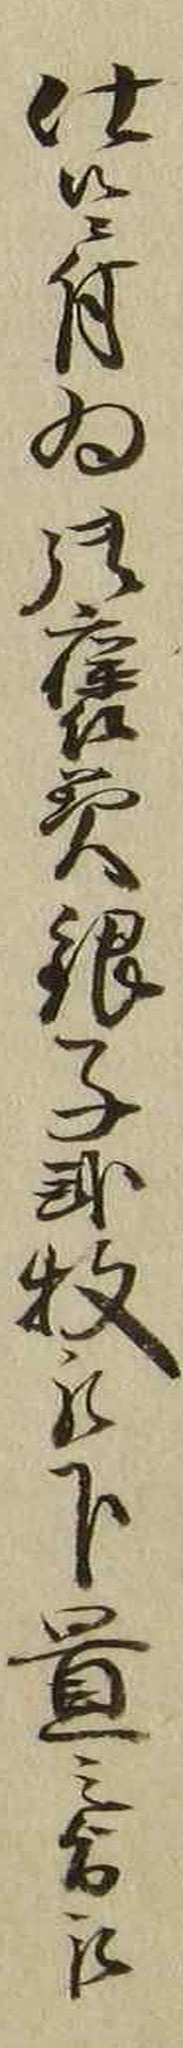仕候に付為御褒美銀子弐枚被下置之旨被
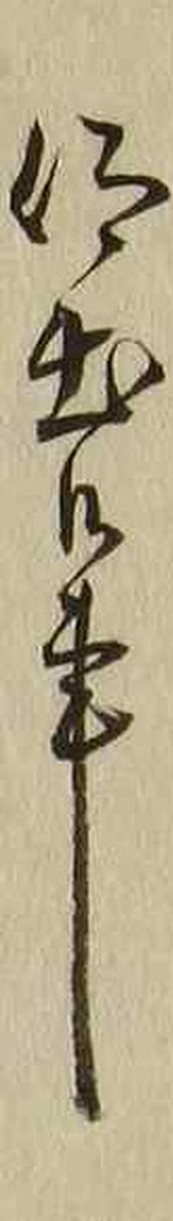仰出候事
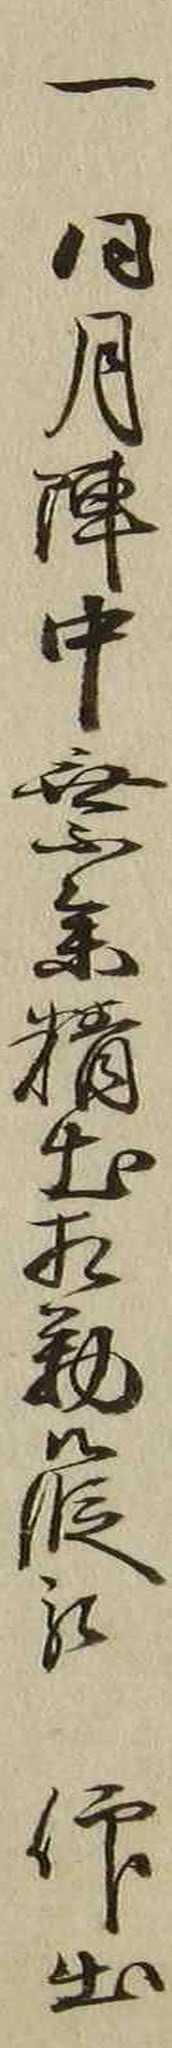一同月陣中無不参精出相勤候段被仰出
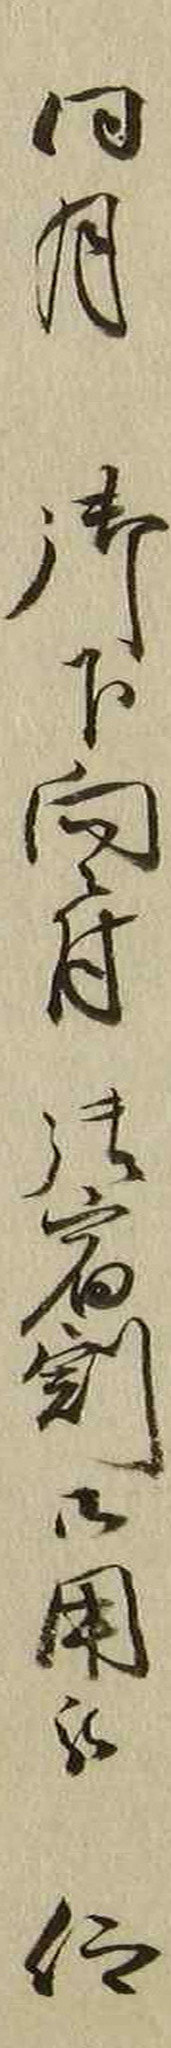同月御下向に付御宿割御用被仰
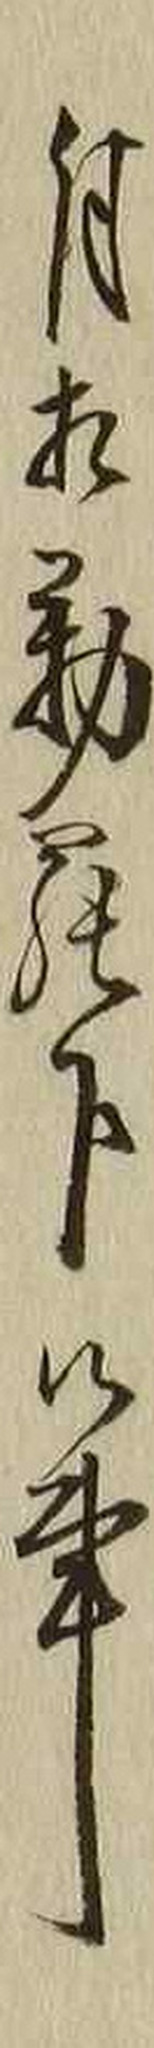付相勤罷下候事
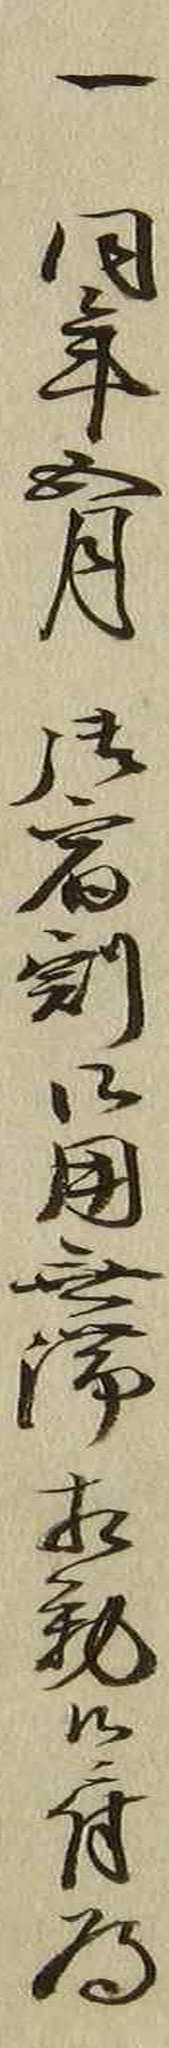一同年五月御宿割御用無滞相勤候に付為
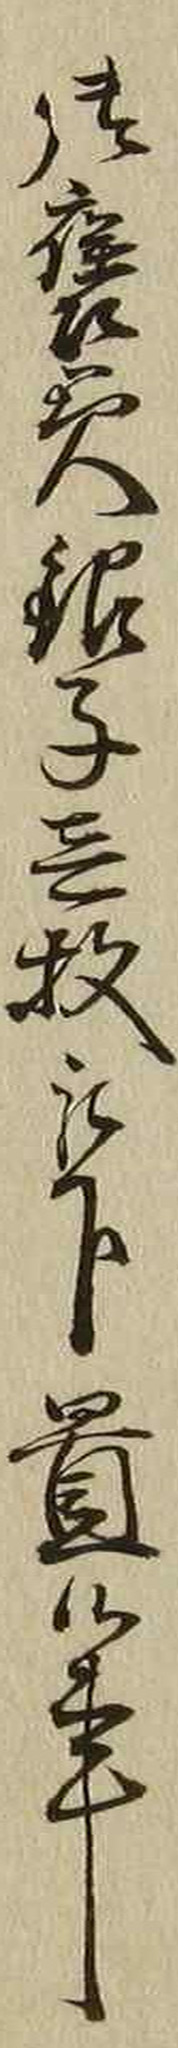御褒美銀子壱枚被下置候事
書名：諸士系譜　巻之67　を之部1
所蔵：会津若松市立会津図書館
